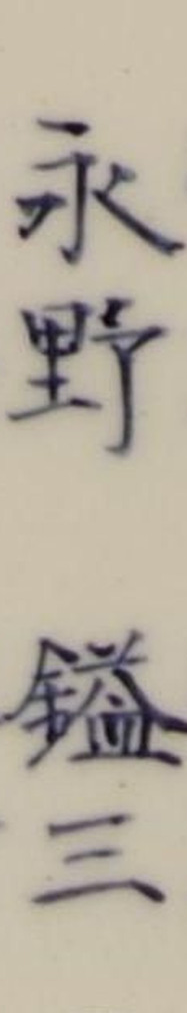永野鑑三
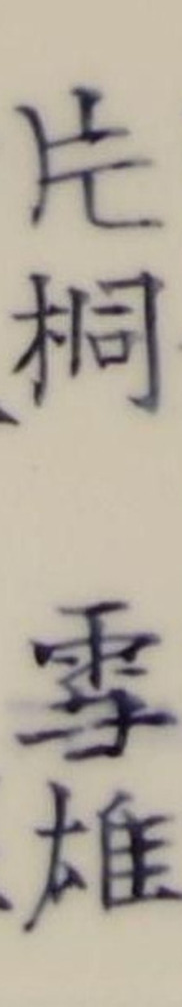片桐雪雄
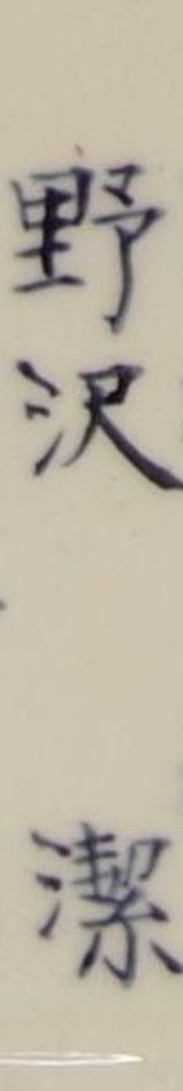野沢潔
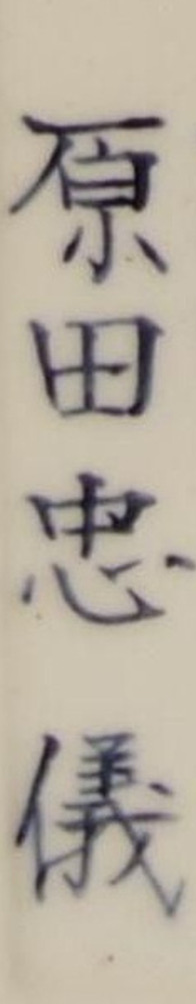原田忠儀

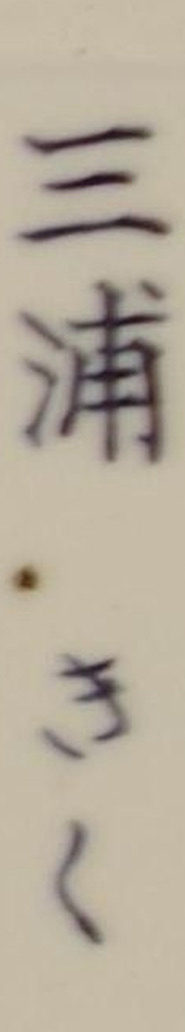三浦きく
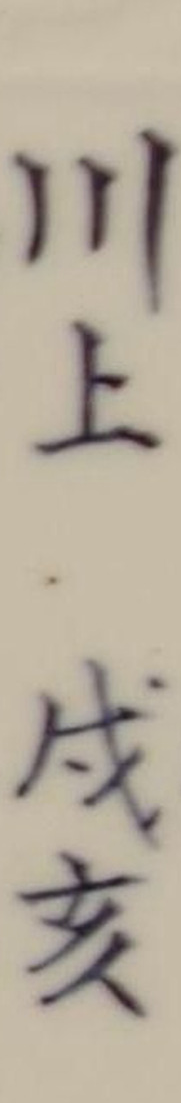川上戌亥
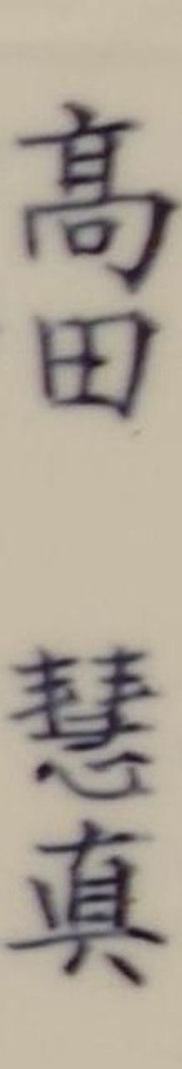高田慧真
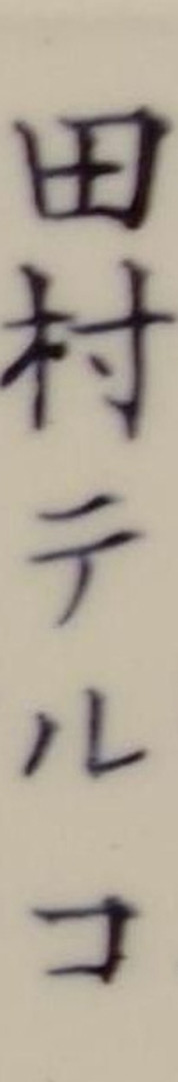田村テルコ
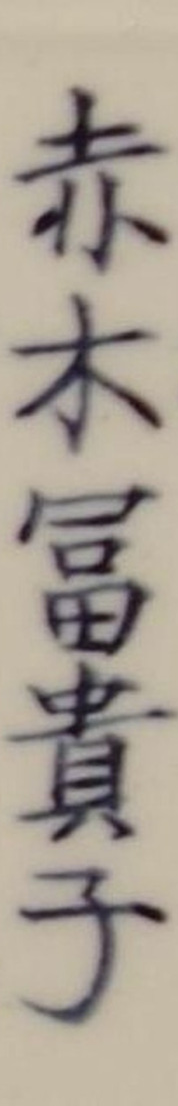赤木富貴子
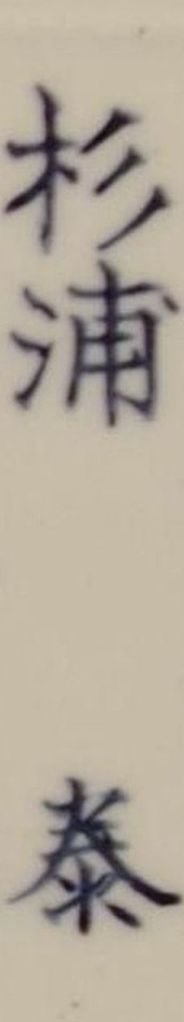杉浦泰
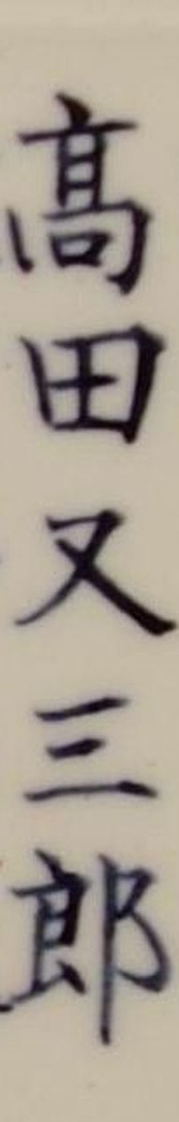高田又三郎
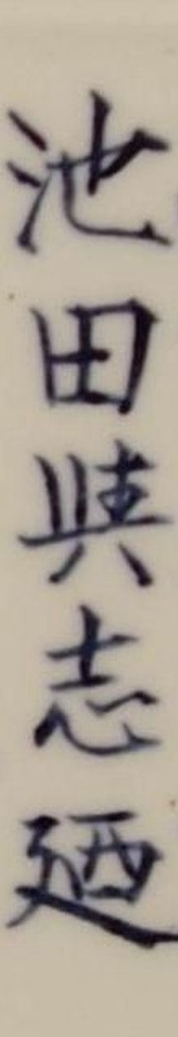池田与志廼
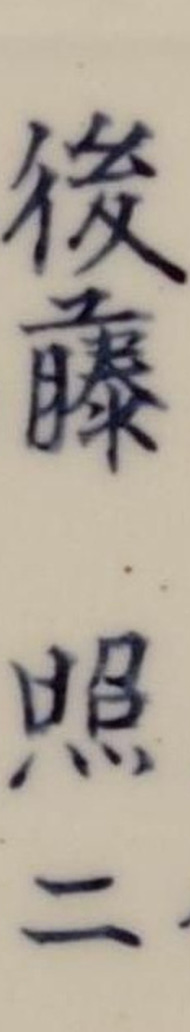後藤照二
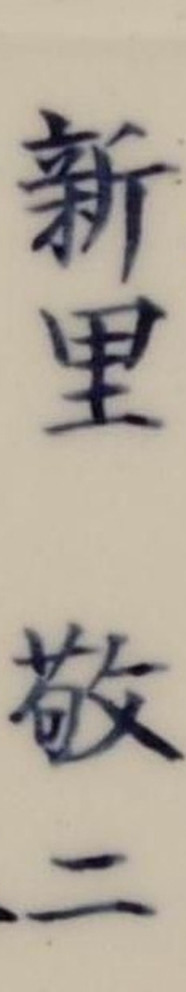新里敬二
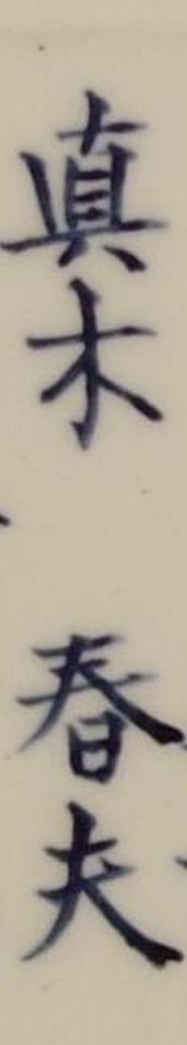真木春夫
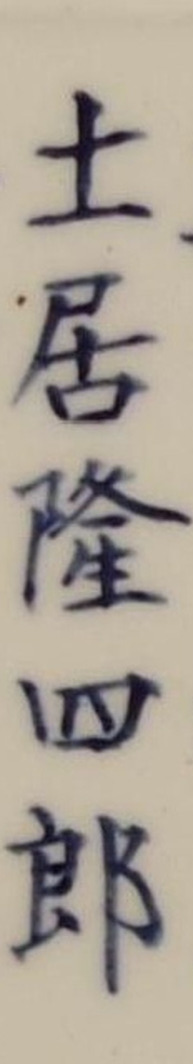土居隆四郎
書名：E~L
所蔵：高野山金剛峯寺
